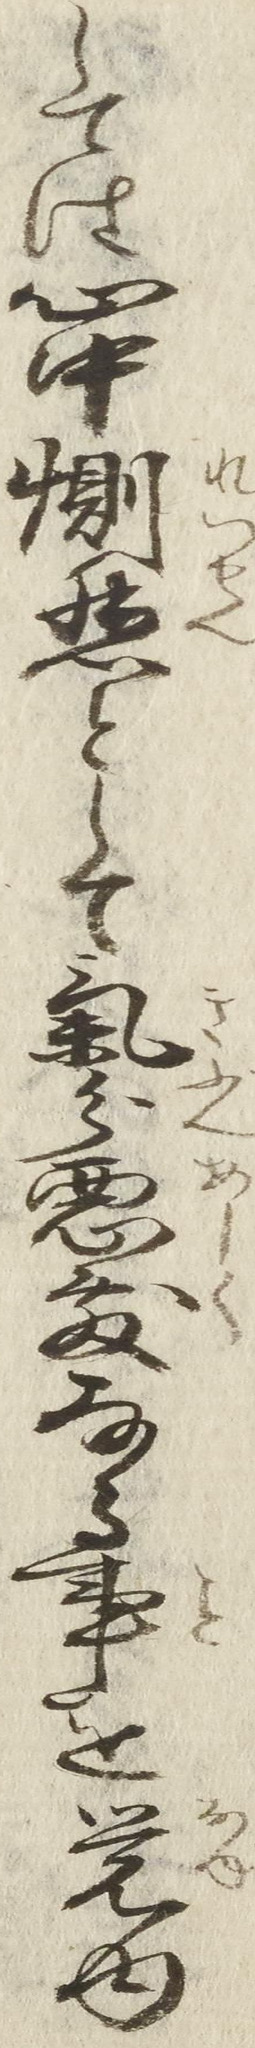しては心中惻然として気分悪敷なる事を覚ゆ
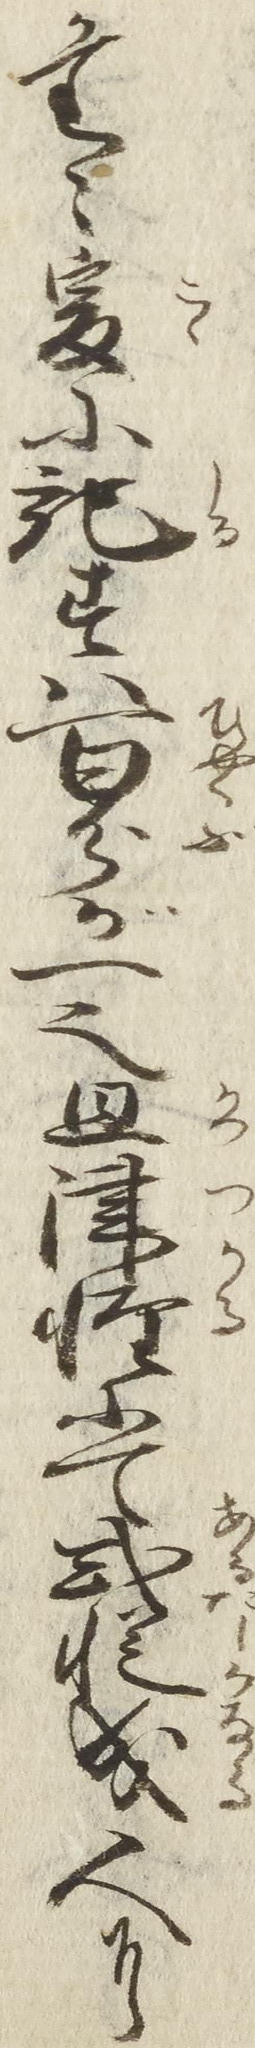たゞ爰に記すは百分が一也且津軽にて或慥成人に
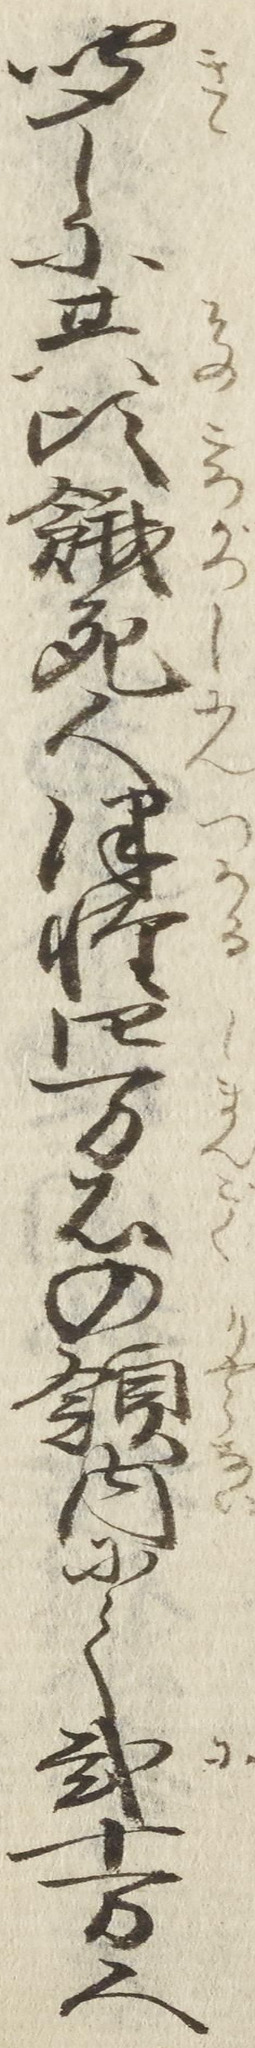聞しに其頃餓死人津軽四万石の領内にて弐十万人
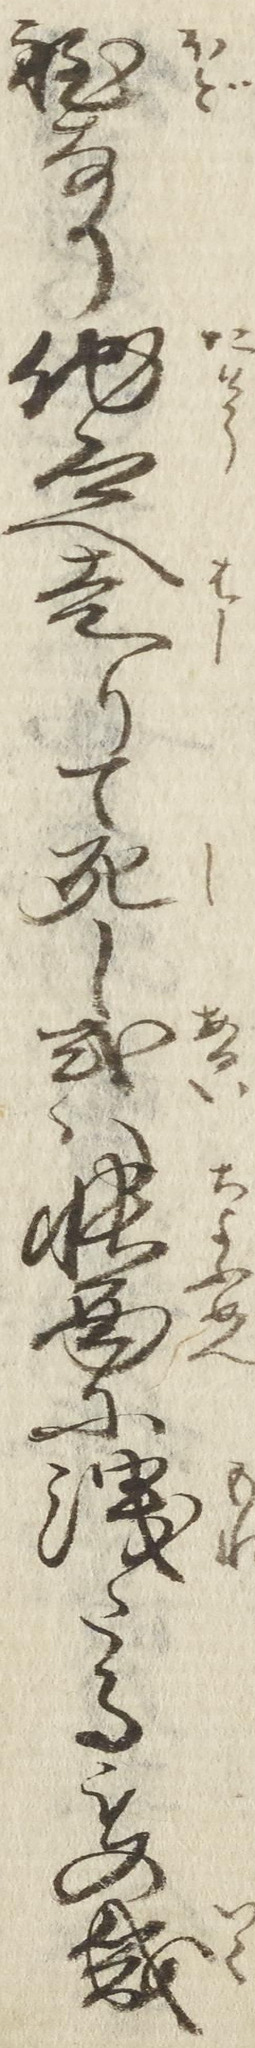程なり他郷へ走りて死し或は帳面に洩たるもの幾
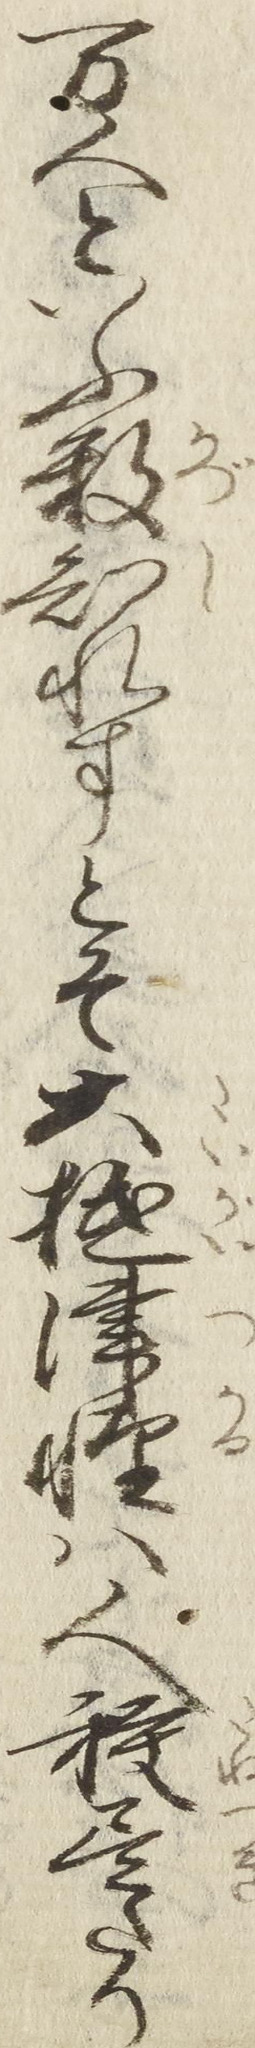万人といふ数知れすとそ大概津軽は人種尽たり
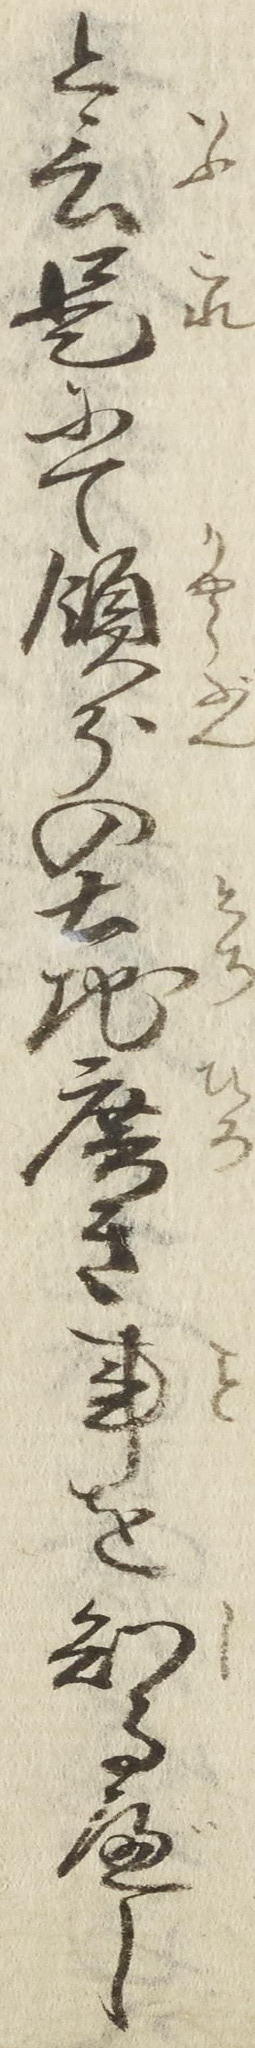と言是にて領分の土地広き事を知るへし

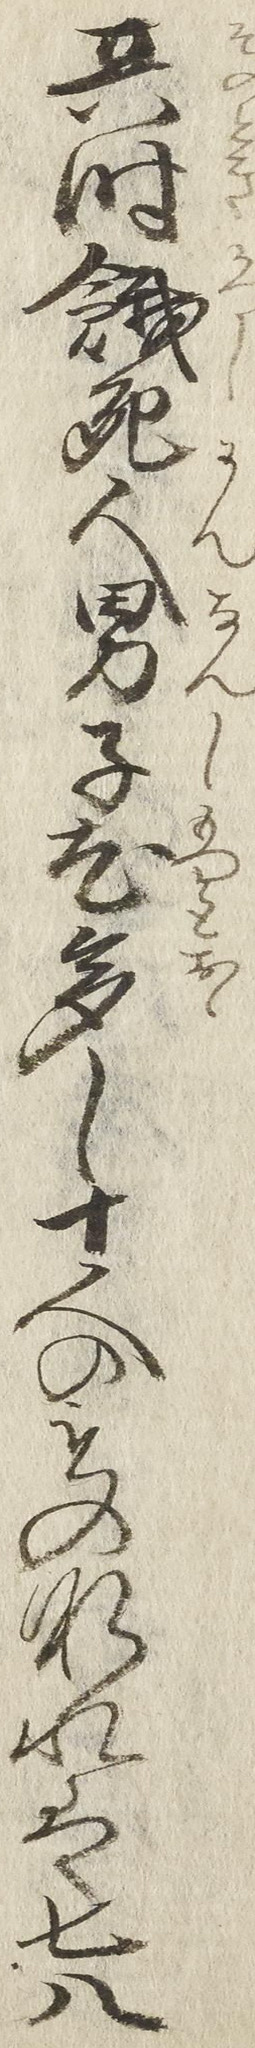其時餓死人男子尤多し十人のものなれは七八
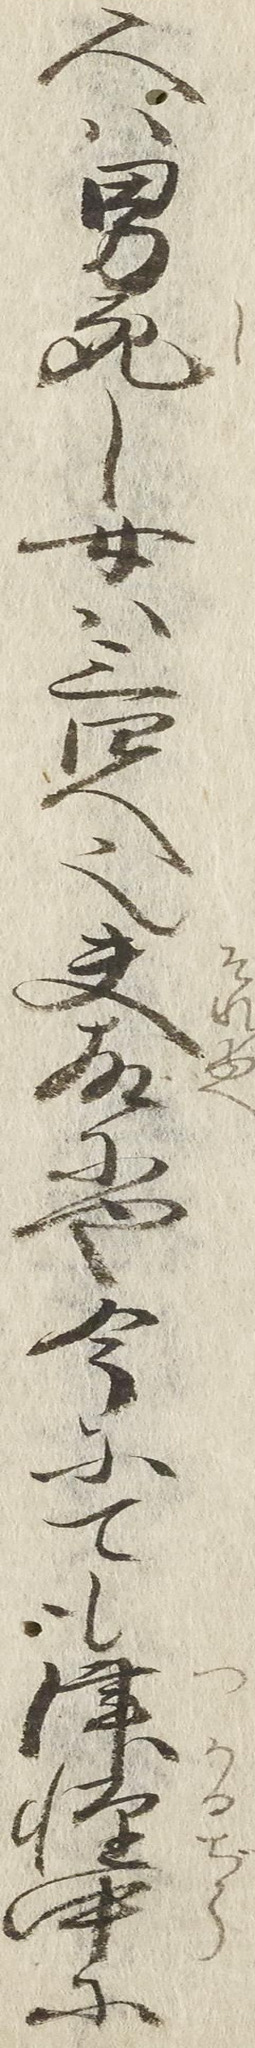人は男死し女は三四人也夫故にや今にても津軽中に
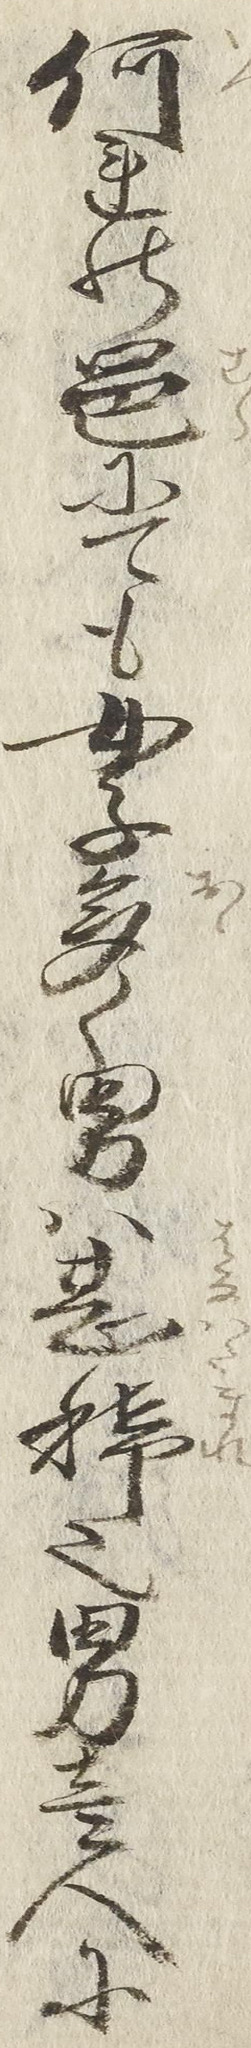何れの邑にても女子多く男は甚稀也男壱人に
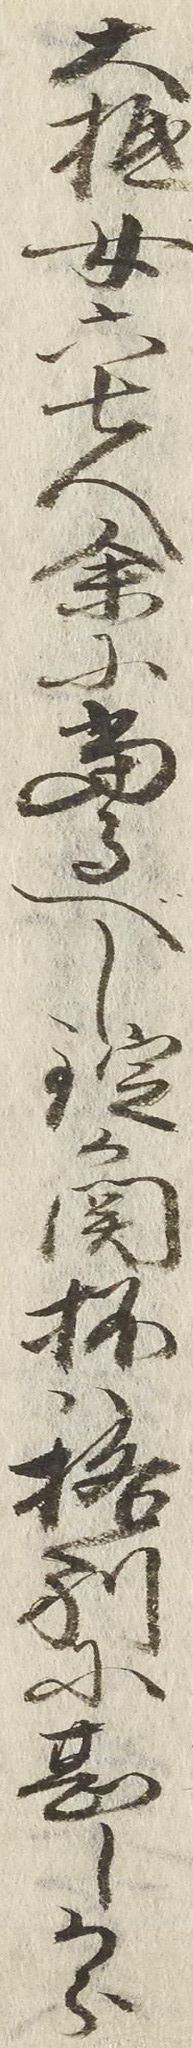大概女六七人余に当るべし錠か関抔は格別に甚しから
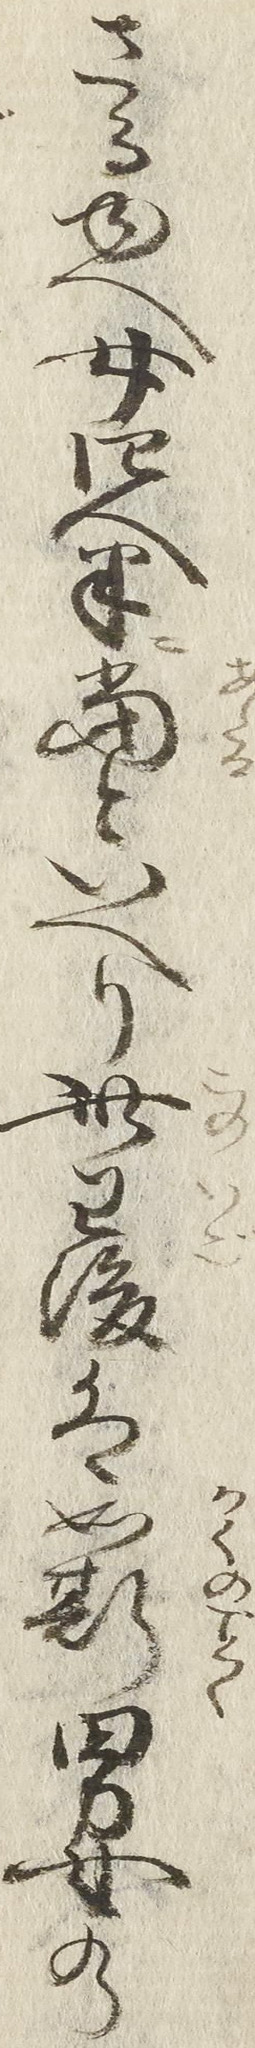さるゆへ女四人半ニ当といへり此已後は如斯男女の
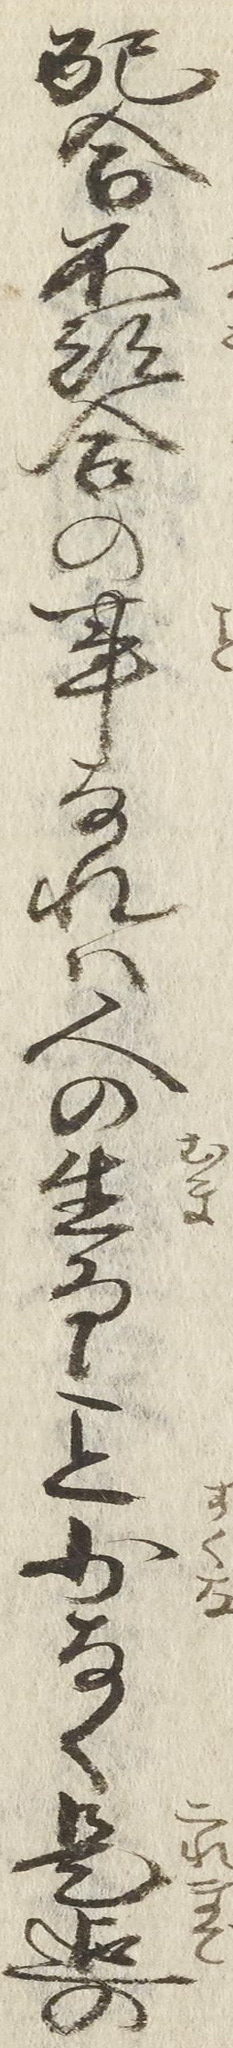配合不都合の事なれは人の生るゝこと少なく是迄の
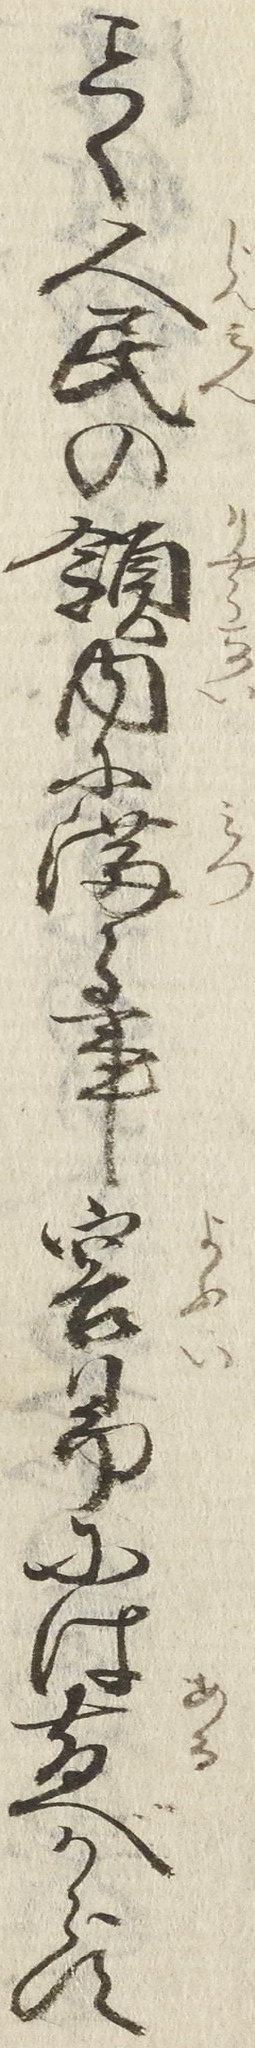ことく人民の領内に満る事容易には有べからす
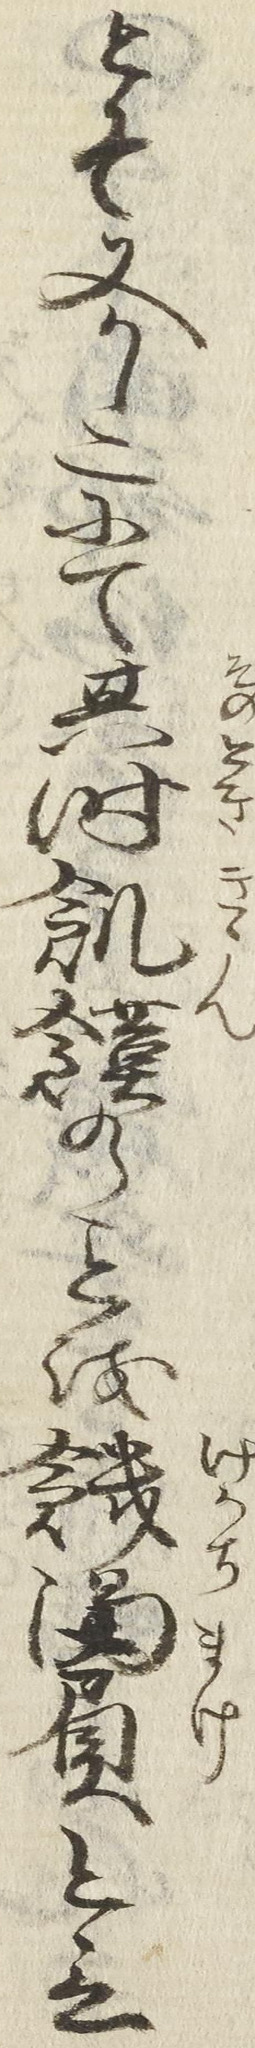とそ又かしこにて其時飢饉のことを餓渇負と言
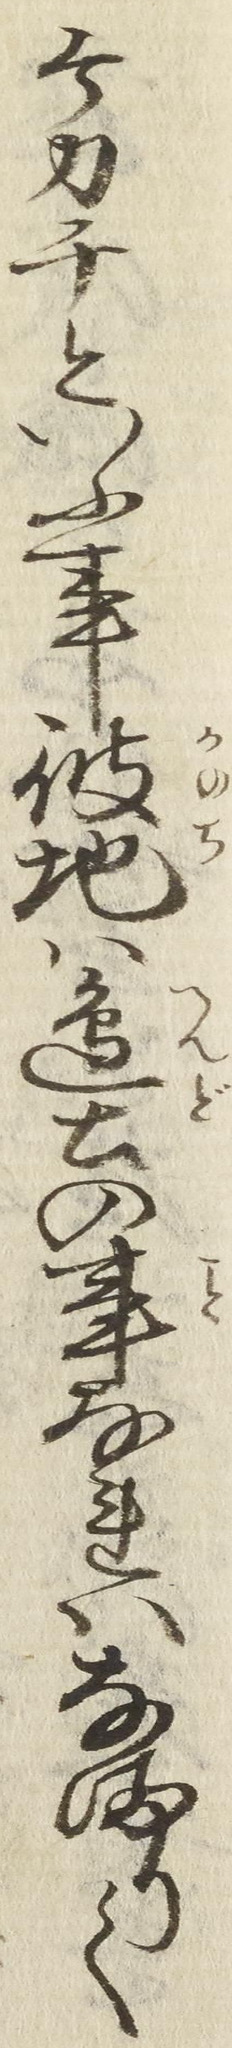ケカチといふ事彼地は辺土の事なれはなまりて
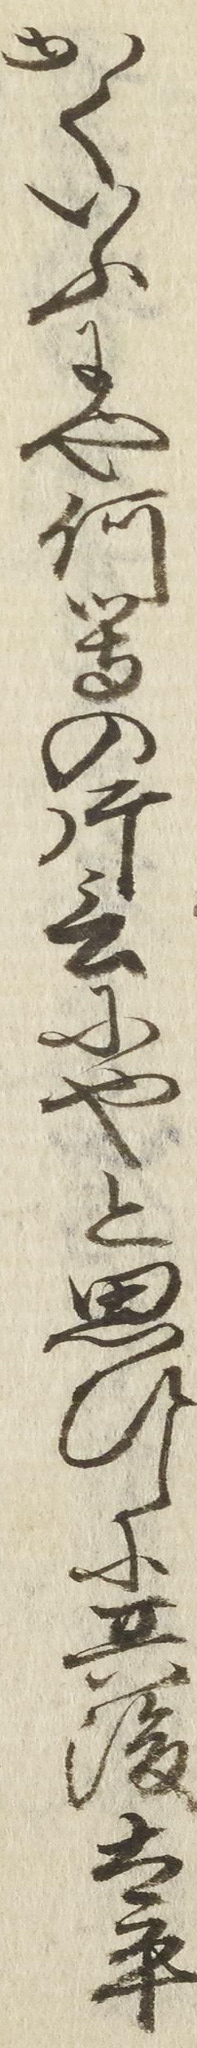かくいふにや何等の片言にやと思ひしに其後太平
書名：天明奇畧　全
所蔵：東京大学地震研究所図書室 Earthquake Research Institute Library, The University of Tokyo, JAPAN
